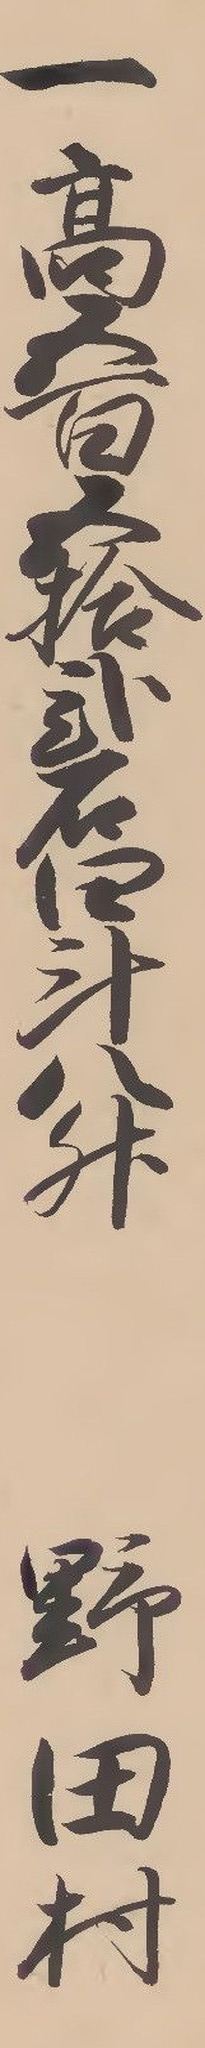一高五百五拾弐石四斗八升野田村

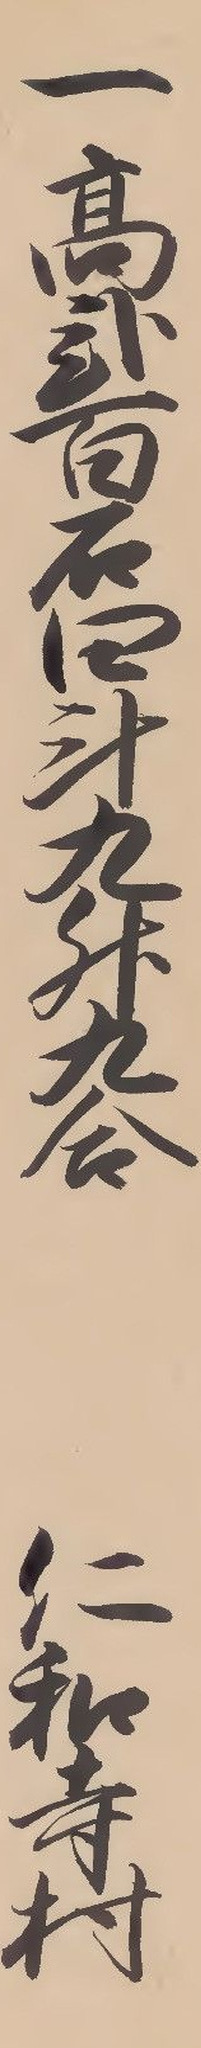一高弐百石四斗九升九合仁和寺村
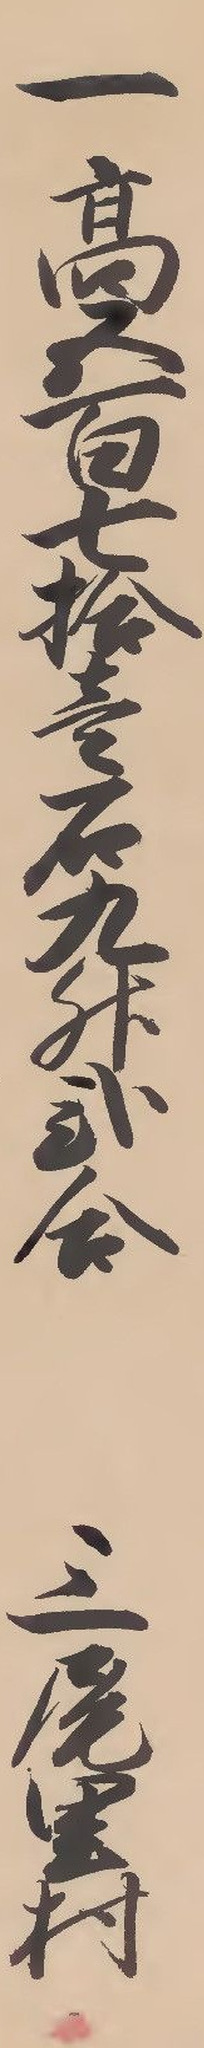一高五百七拾壱石九升弐合三尾里村
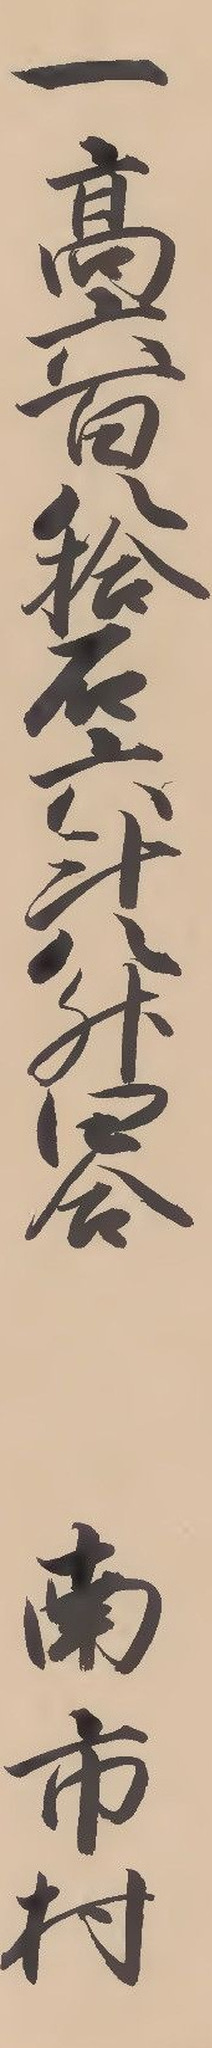一高六百八拾石六斗八升四合南市村
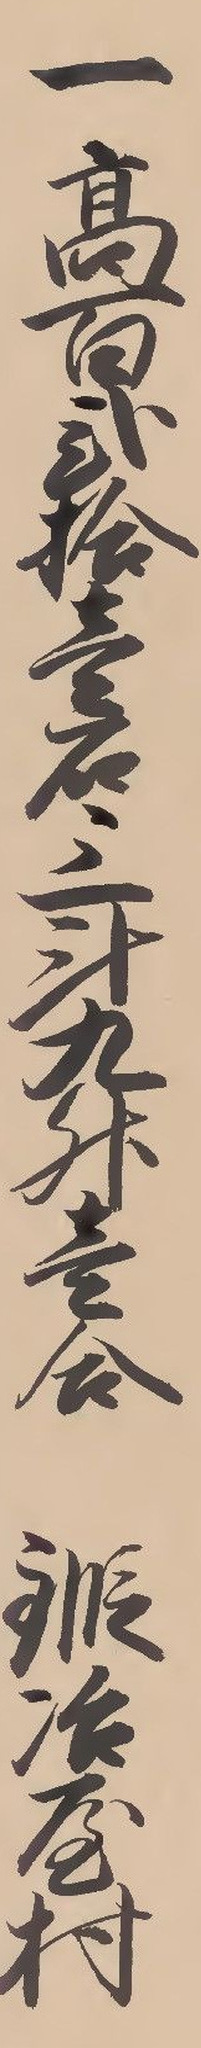一高百弐拾壱石三斗九升壱合鍛冶屋村
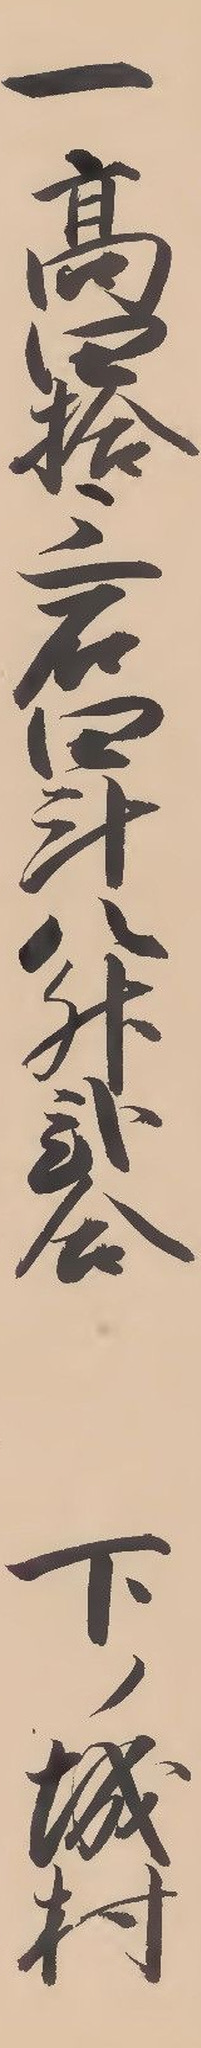一高四拾三石四斗八升弐合下ノ城村
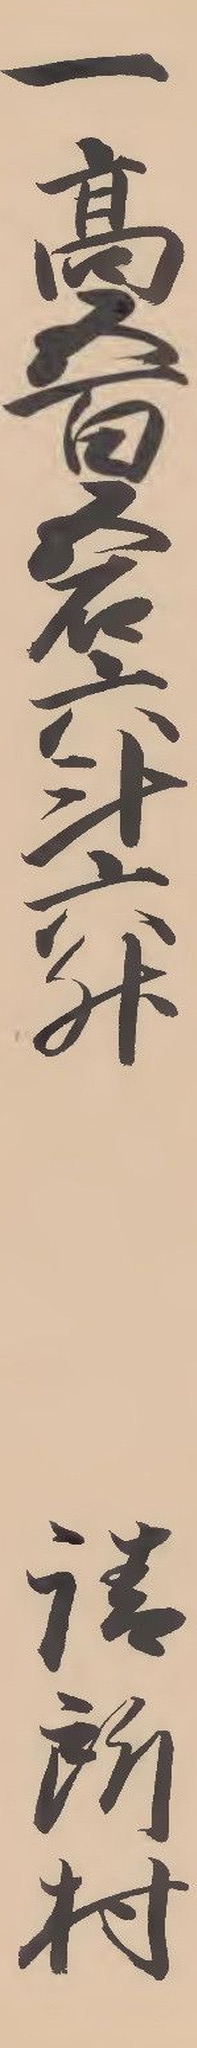一高五百五石六斗六升請所村
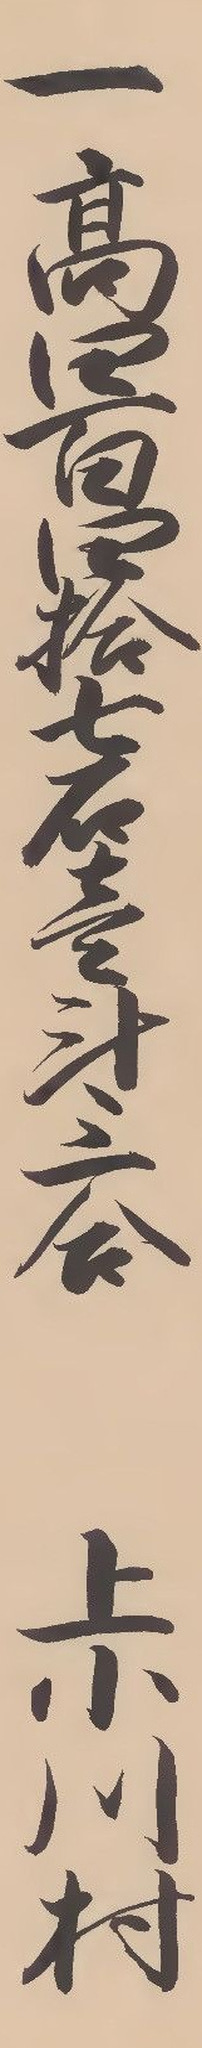一高四百四拾七石壱斗三合上小川村
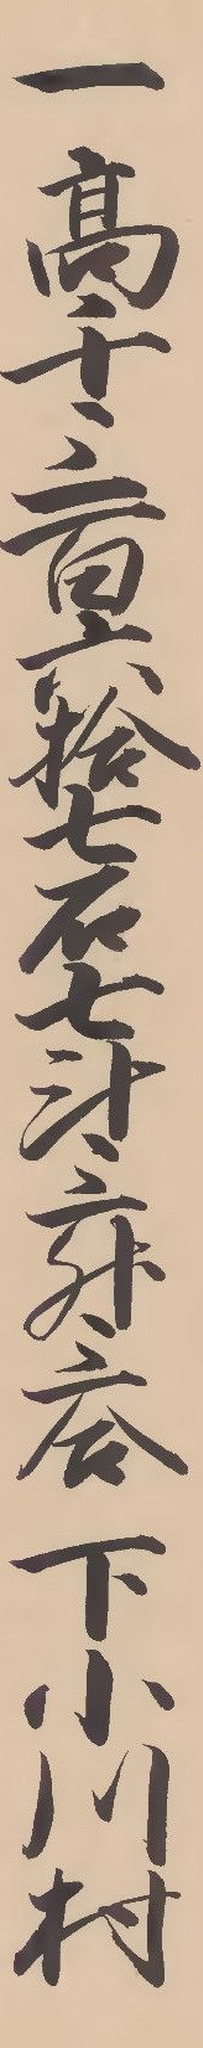一高千三百六拾七石七斗三升三合下小川村

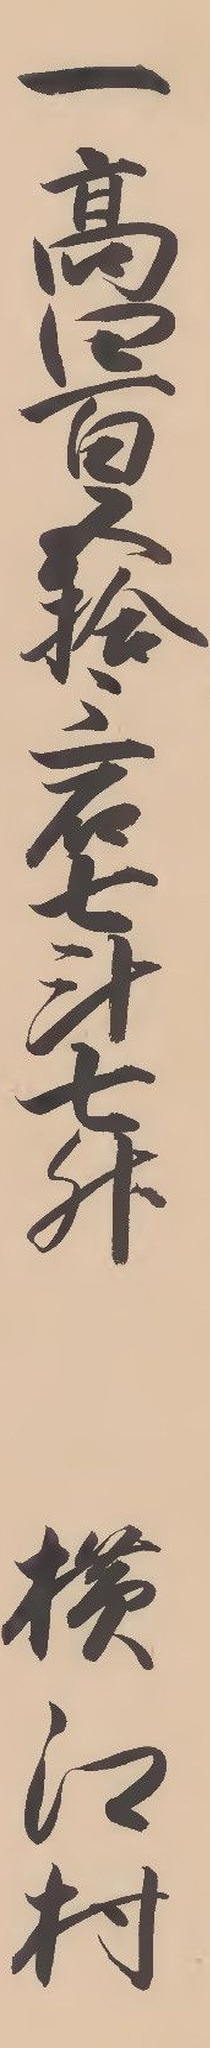一高四百五拾三石七斗七升横江村
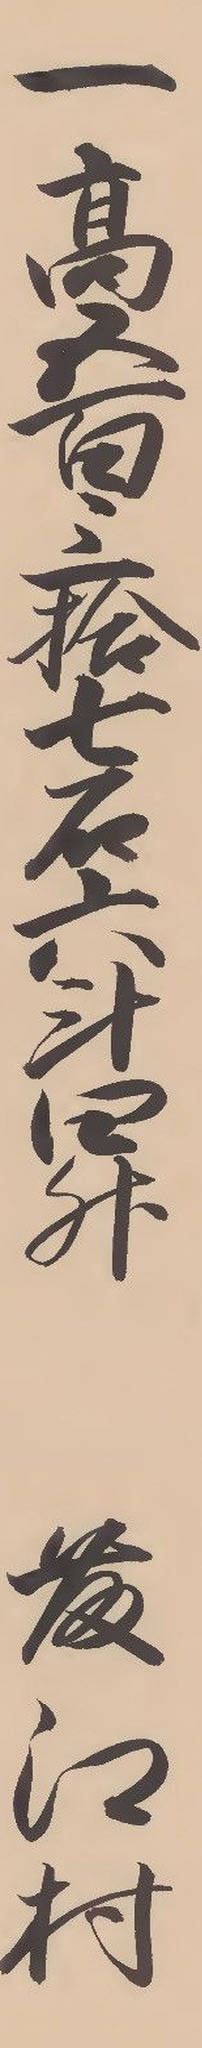一高五百三拾七石六斗四升藤江村
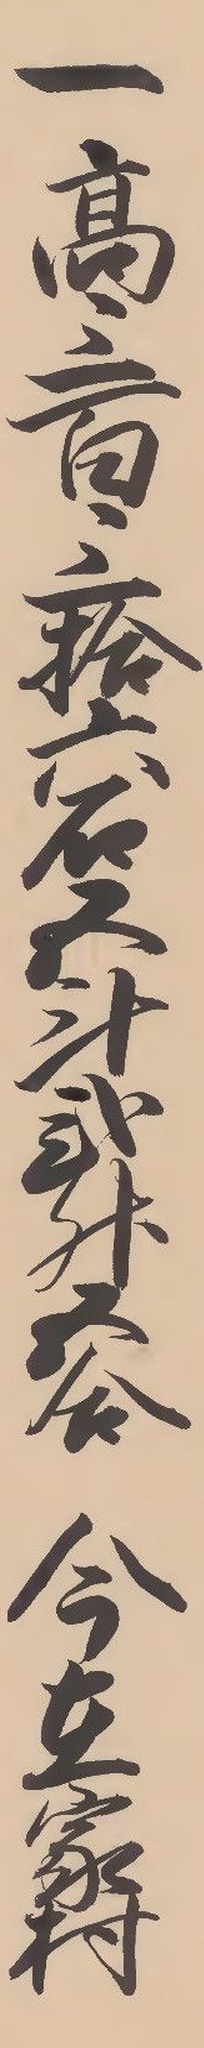一高三百三拾六石五斗弐升五合今在家村
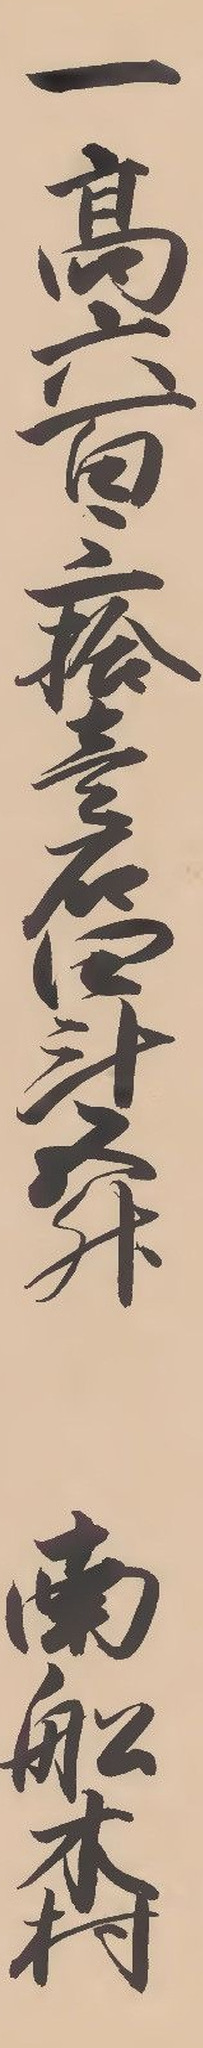一高六百三拾壱石四斗五升南船木村
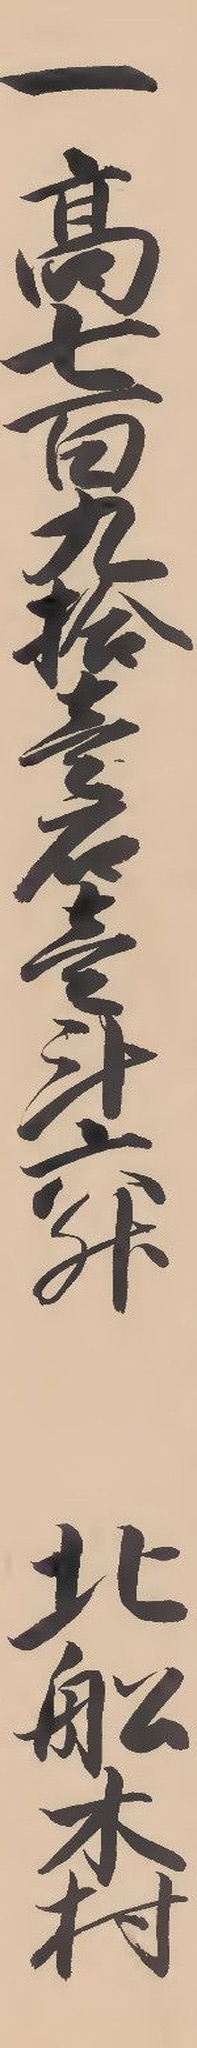一高七百九拾壱石壱斗六升北船木村
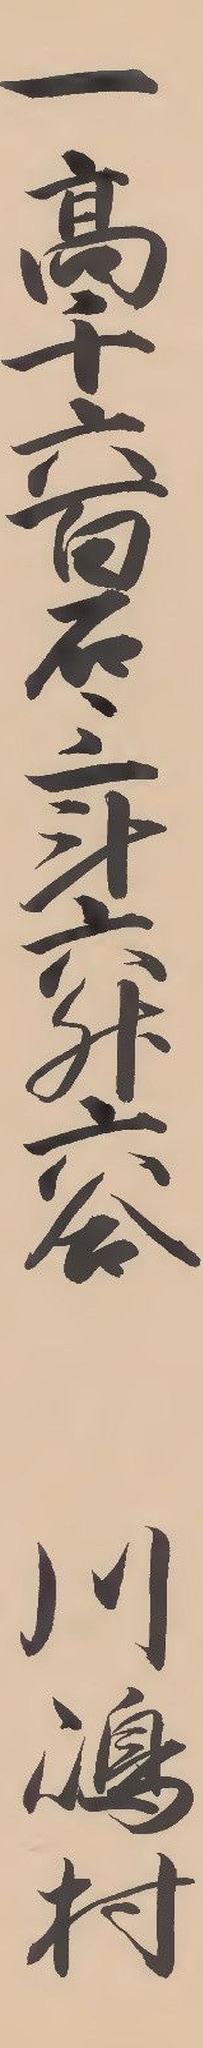一高千六百石三斗六升六合川島村
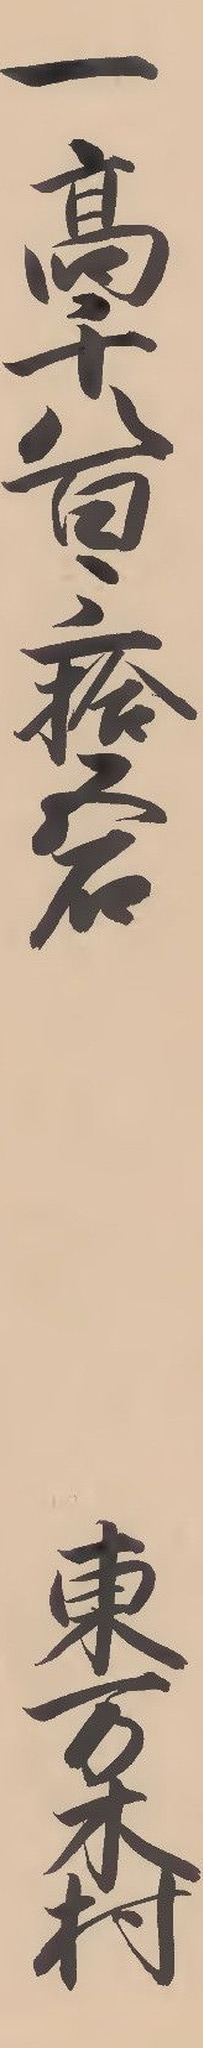一高千八百三拾五石東万木村
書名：近江国郷帳
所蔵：国立公文書館 National Archives of Japan
